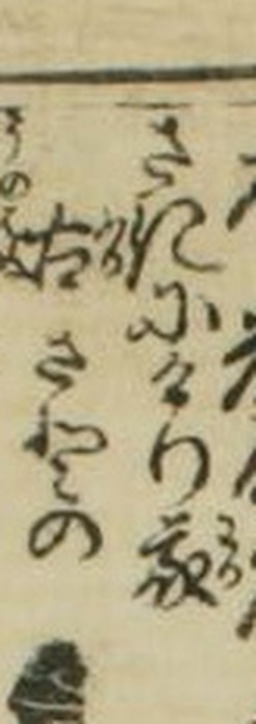古さとの
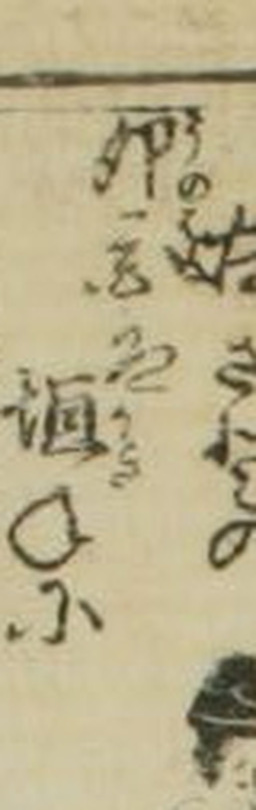垣ねに
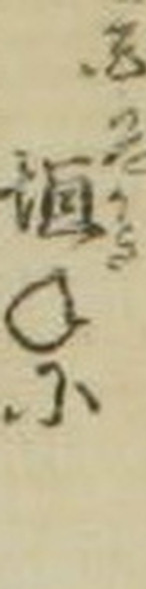のねに
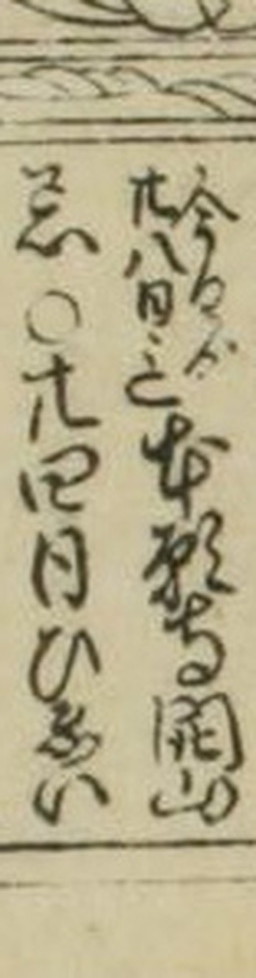忌○廿四日ひゑい
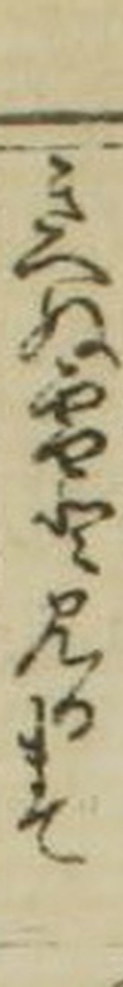きへぬ雪と見るまて
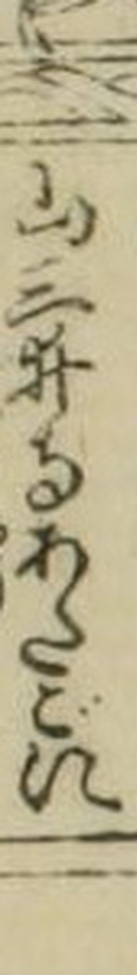山三井寺あたごに
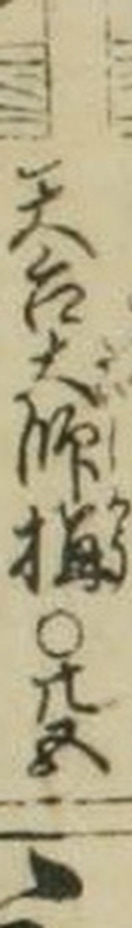天台大師講○廿五
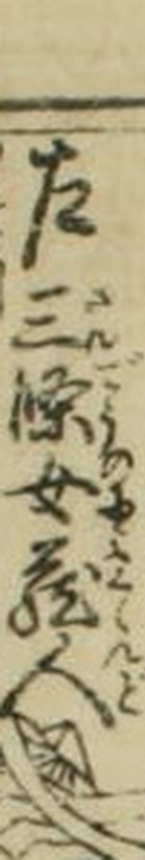左三条女蔵人
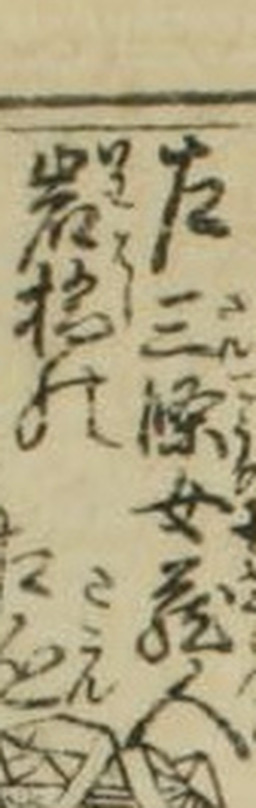岩橋の左近
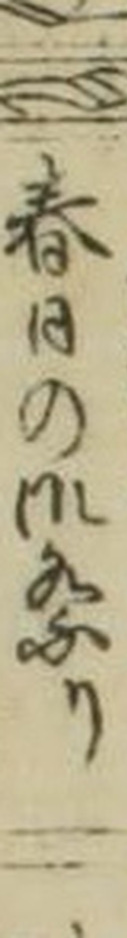春日の御祭り
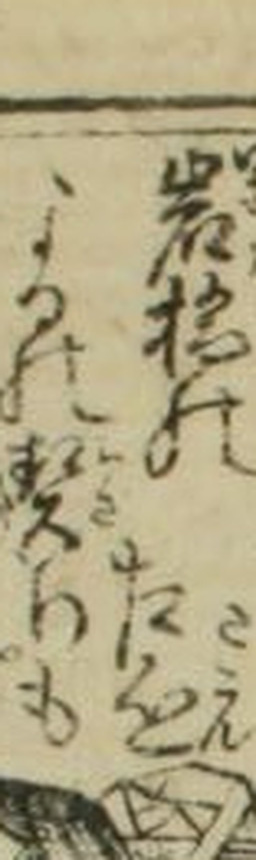よるの契りも
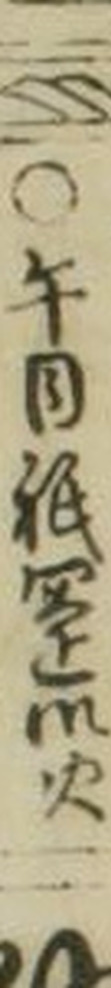○午日祇園御火
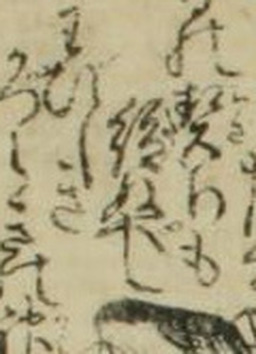絶ぬべし
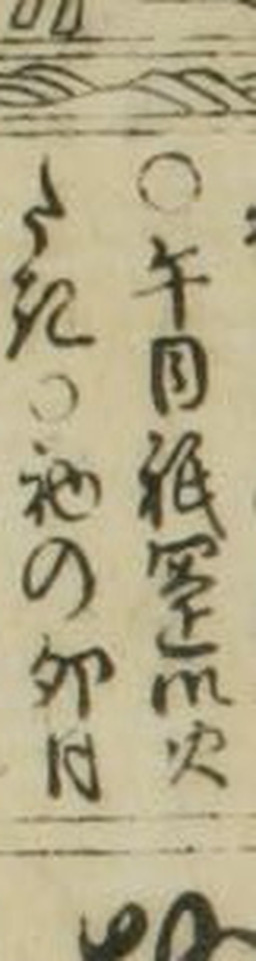たき○初の卯日
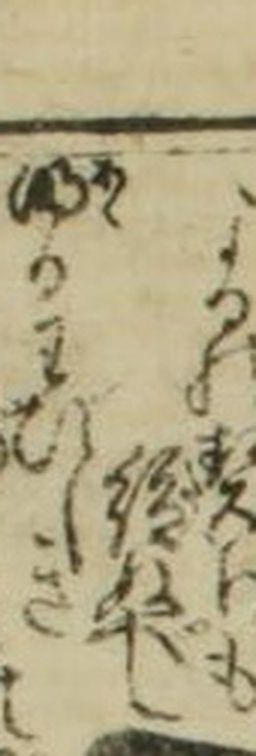明るわびしき
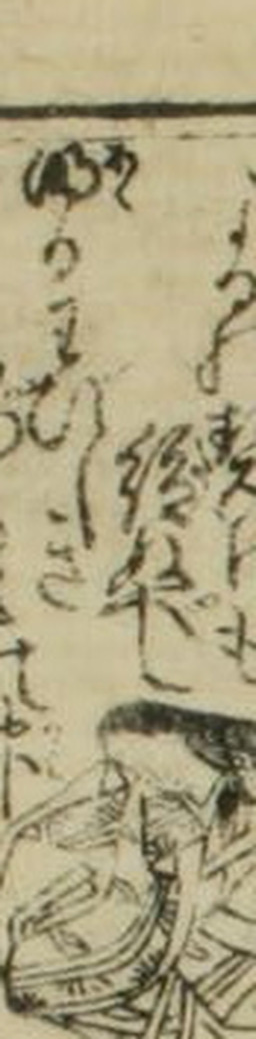明るわびしき
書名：女源氏教訓鑑
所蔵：東京学芸大学附属図書館
